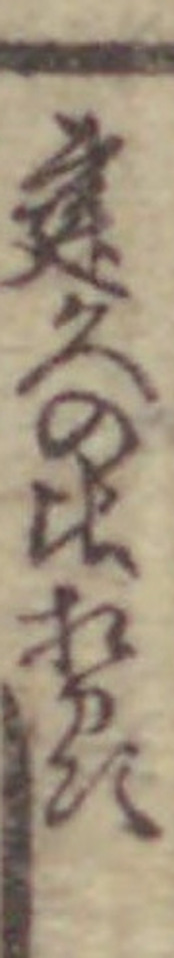建久の頃相州
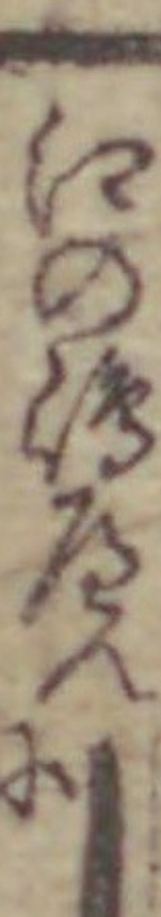江の嶋へんに
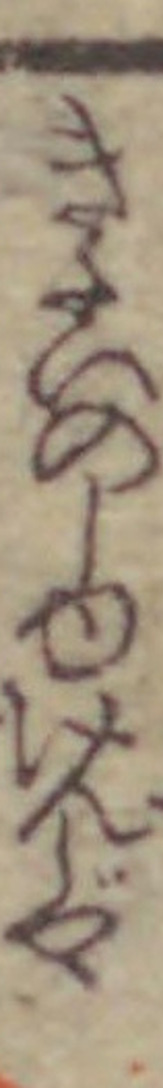きたいのしゆけんじや
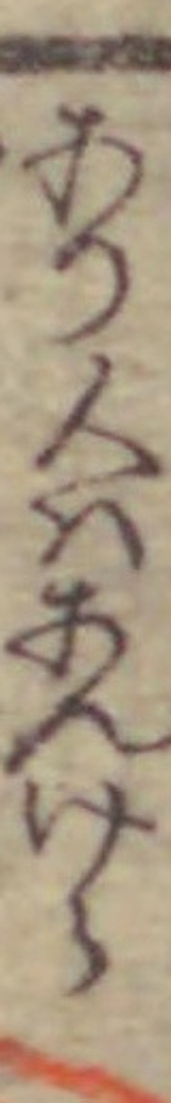あり人はあんけら
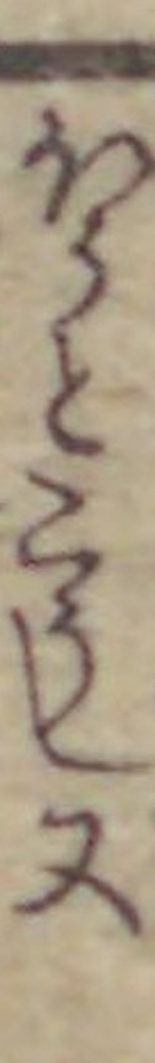ほうとこうし又
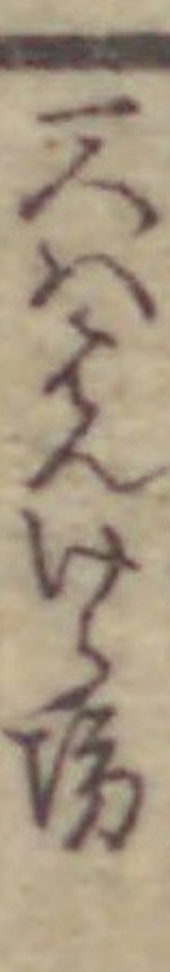一人ははんけら坊
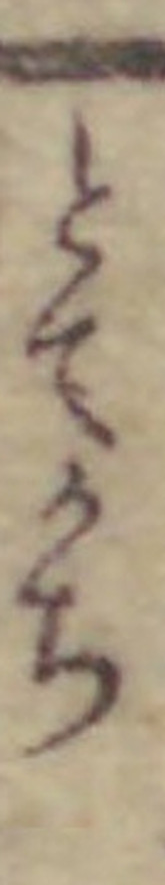とてかち
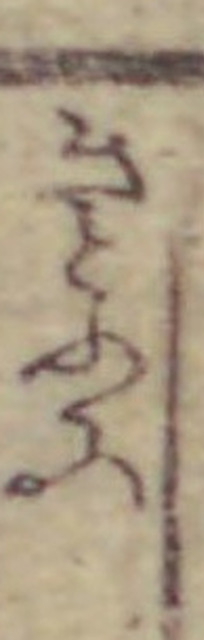きとふに
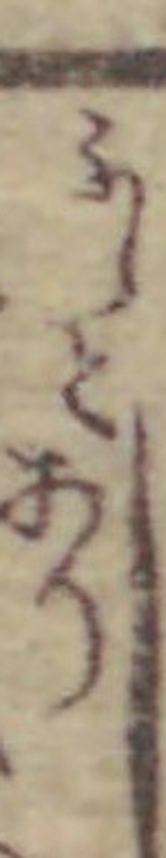ふしとあり
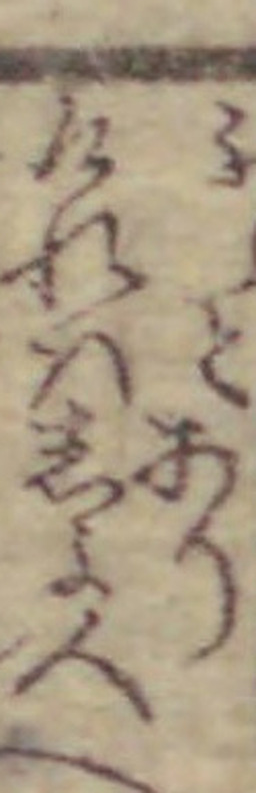けれはしよ人
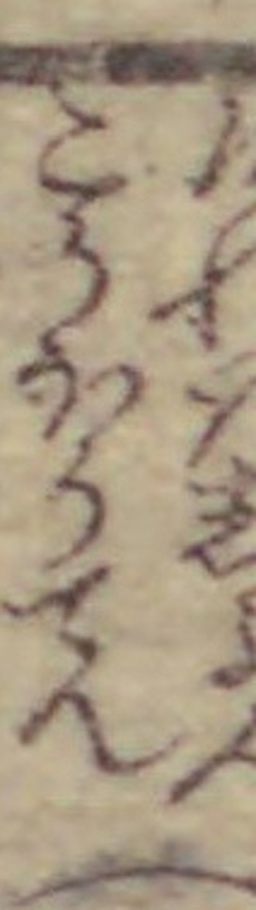こうほうてん
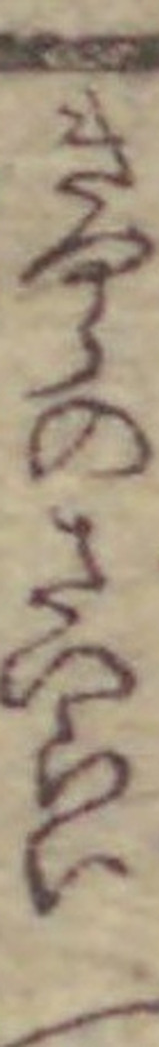きやうのさいらい
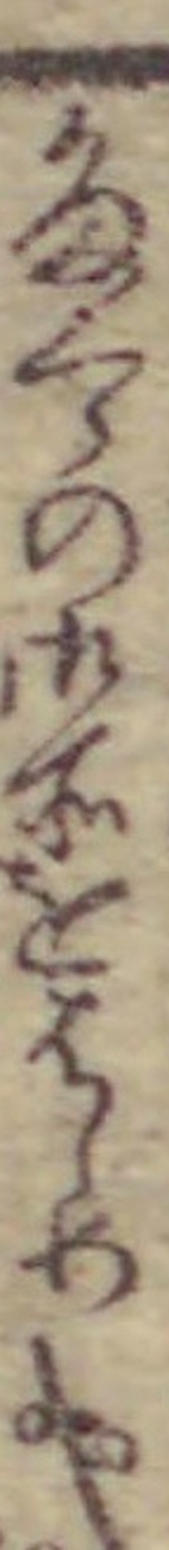かまくらの御所をはしめ
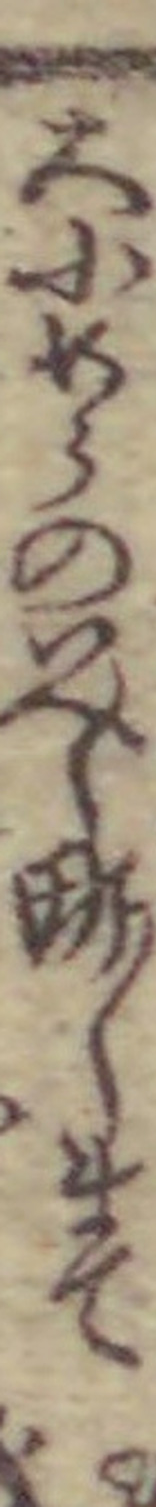大小めうのいへ〳〵町〳〵まて
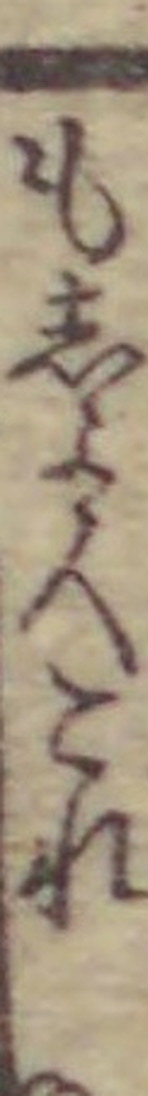もしよにんこれ
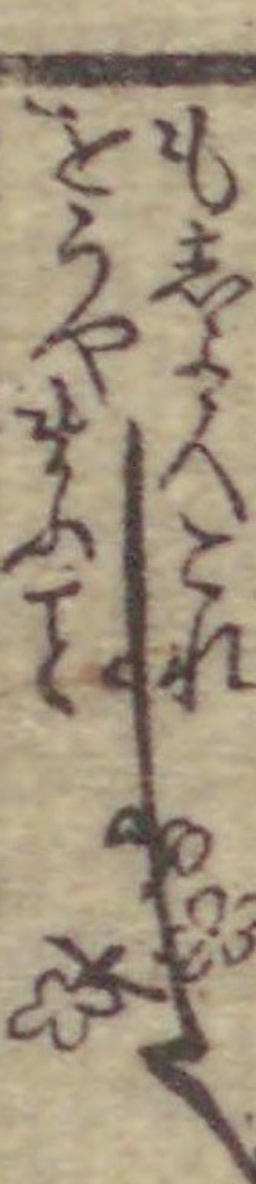をうやまふこと
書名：止而道致虚録 3巻
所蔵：国立国会図書館 National Diet Library, JAPAN
